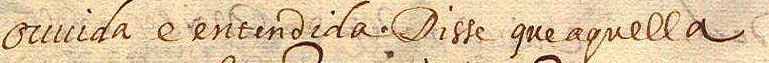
ouuida e entendida. Disse que aquella
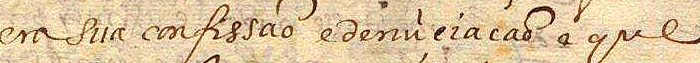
era sua confissão e denūciaçaõ e que
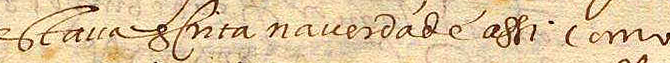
estaua esCrita na uerdade assi como
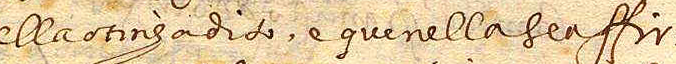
ella o tinha dito, e que nella se affir
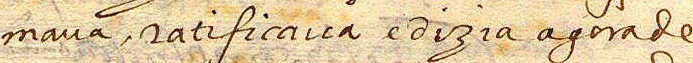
maua, ratificaua e dizia agora de
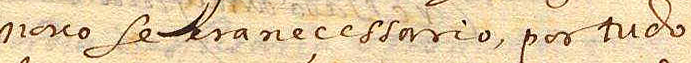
nouo so era necessario, por tudo
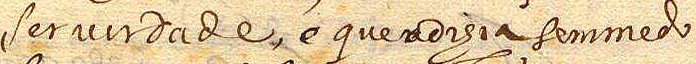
ser uerdade, e que o dizia sem medo
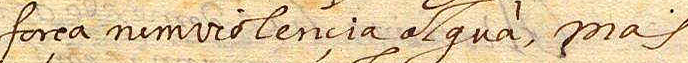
força nem violencia alguā mas
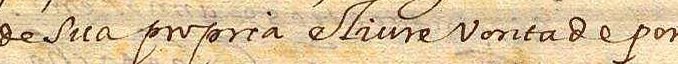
de sua propria e Liure vontade por
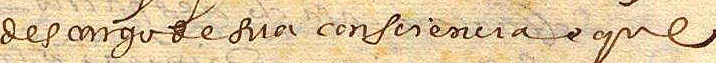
descargo de sua consciencia o que
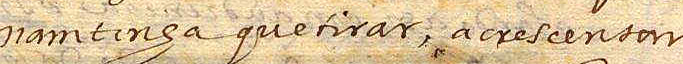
nam tinha que tirar, acrescentar
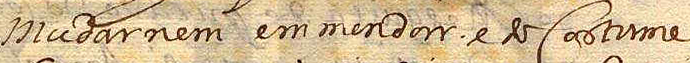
mudar nem emmendar e do Costume
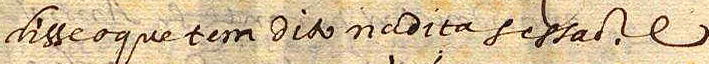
disse o que tem dito na dita sessaõ e
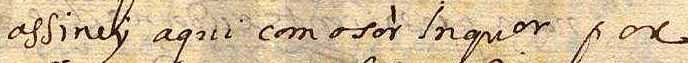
assiney aqui com o sōr Inquor por
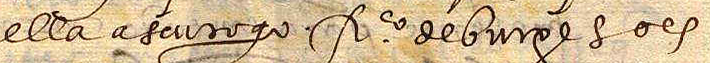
ella a seu rogo frco de burges o es
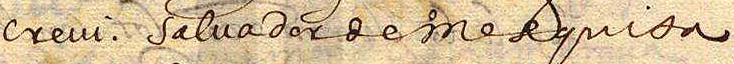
creui Saluador de mesquita
